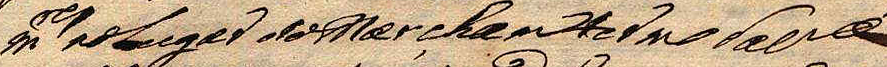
mres no Lugar do Marçham termo da v.a
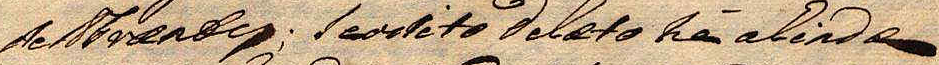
de Abrantes; se o dito delato hé ahinda
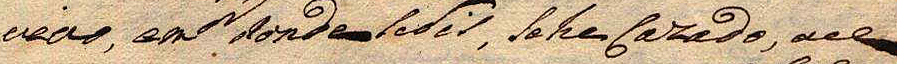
vivo, e mor donde se dis, se he Cazado, ou
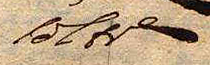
soltro
